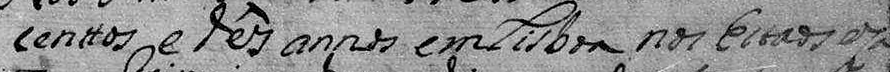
centtos, e dês annos em Lisboa nos Estaos e Ca
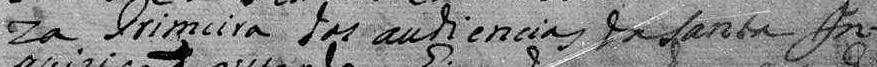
za Primeira das audiencias da Santa Jn
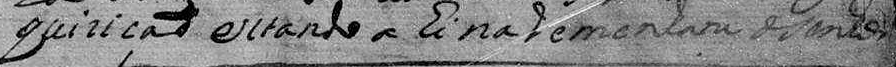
quiziçaõ estando ahi na de menham o senhor
